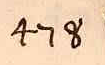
478
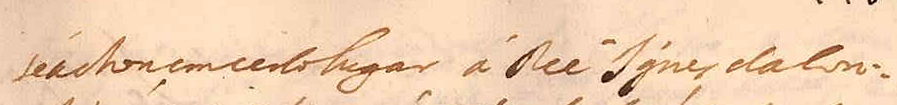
se achou em certo lugar á Reé Ignes da Con
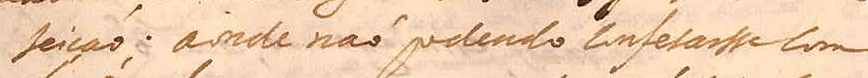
seiçaõ; aonde naõ podendo confesarsse com
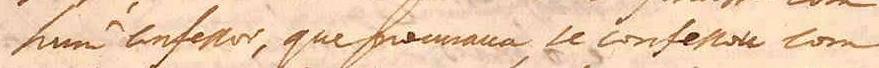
hum confessor, que procuraua, se confessou com
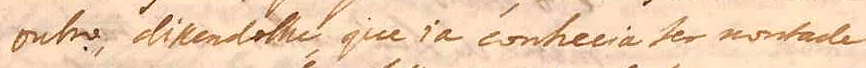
outro, dissendolhe, que ia conhecia ser uontade
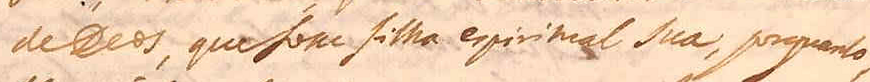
de Deos, que fosse filha espiritual sua, porquanto
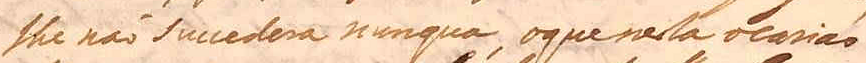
lhe naõ succedera nunqua o que nessa ocaziaõ
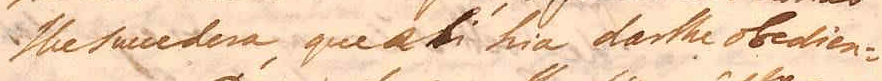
lhe succedera, que ahi hia darlhe obedien
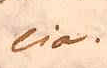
cia.
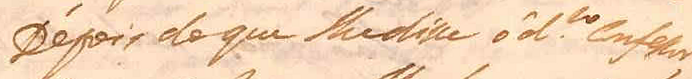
Depois do que lhe disse o d.to Confessor
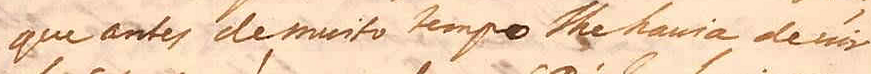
que antes de muito tempo lhe hauia de uir
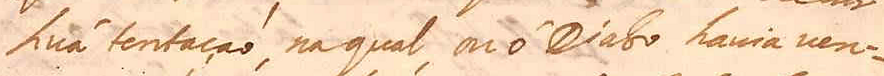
huā tentaçaõ, na qual, ou ó Diabo hauia uen
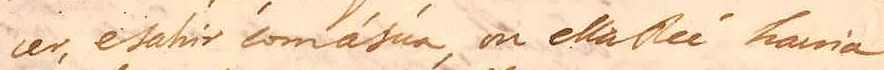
cer, e sahir com á sua, ou ella Reé hauia
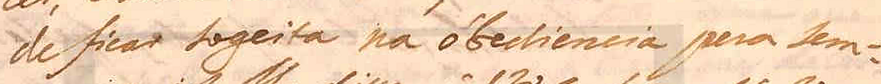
de ficar sogeita na óbediencia pera sem
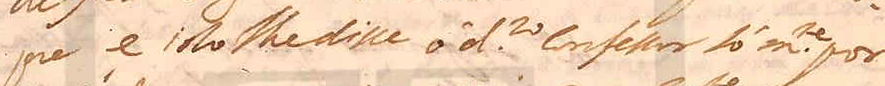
pre, e isto lhe disse o d.to Confessor sómte por
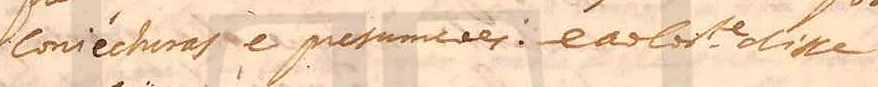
coniecturas e presumçoes. e ao Cost.e disse
